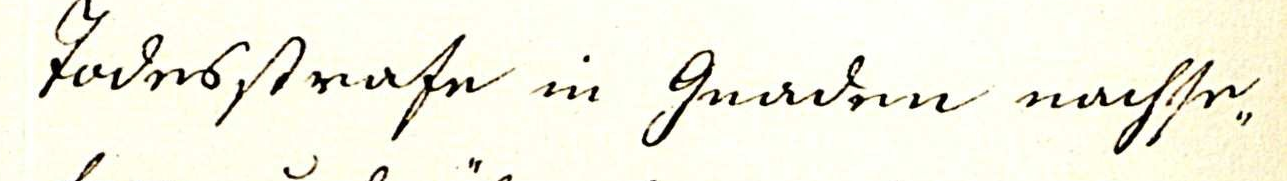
Todesstrafe in Gnaden nachse¬
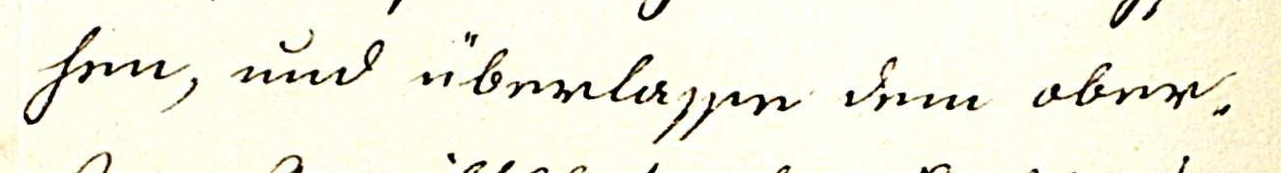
hen, und überlasse dem ober¬
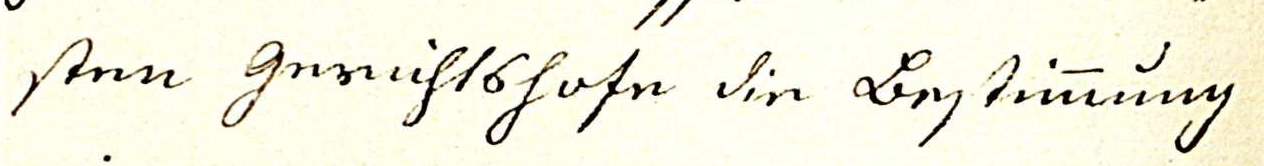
sten Gerichtshofe die Bestimmung
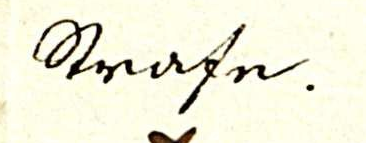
Strafe
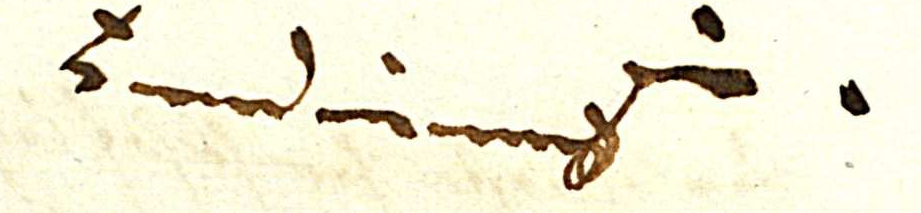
Ferdinand
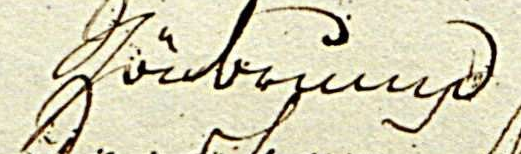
Schönbrunn
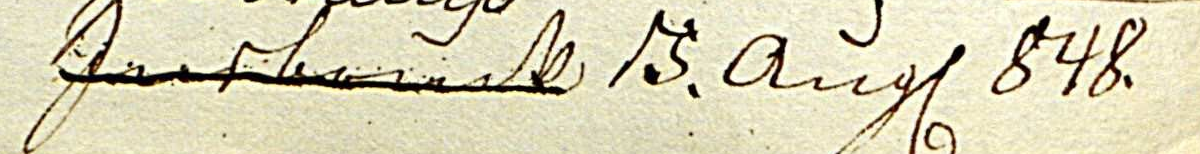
Innsbruck 15. August [1]848
